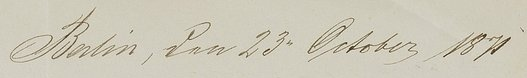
Berlin, den 23t October 1871
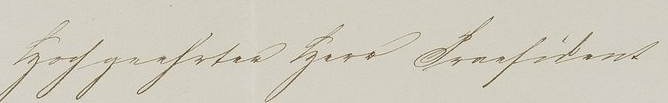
Hochgeehrter Herr Praesident
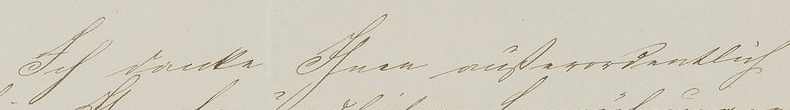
Ich danke Ihnen außerordentlich
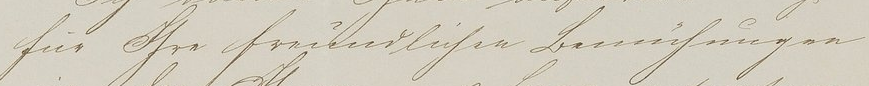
für Ihre freundlichen Bemühungen
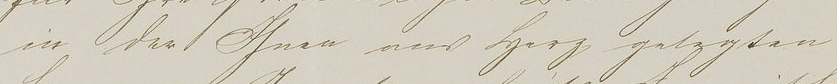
in der Ihnen ans Herz gelegten
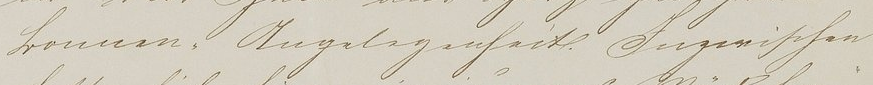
Bonnen -Angelegenheit. Inzwischen
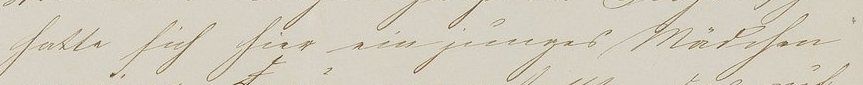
hatte sich hier ein junges Mädchen
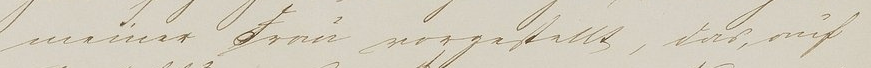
meiner Frau vorgestellt, das, auf
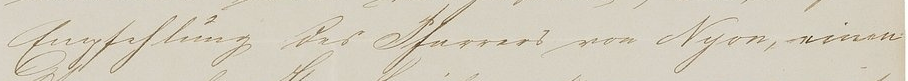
Empfehlung des Pfarrers von Nyon, einen
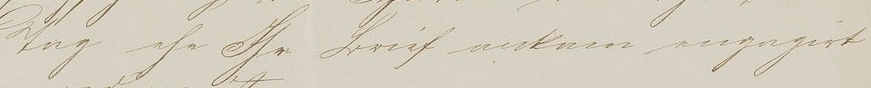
Tag ehe Ihr Brief ankam engagirt
